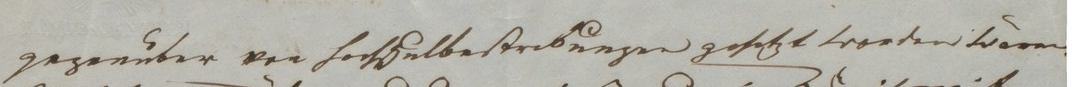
gegenüber von Hochschulbestrebungen gesetzt worden wären.
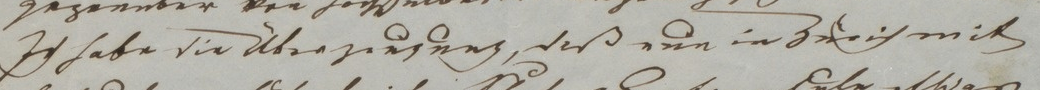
Ich habe die Überzeugung, daß nun in Zürich mit
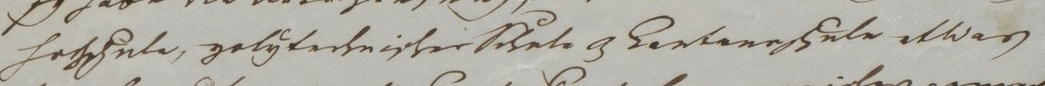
Hochschule, polytechnischer Schule & Cantonsschule etwas
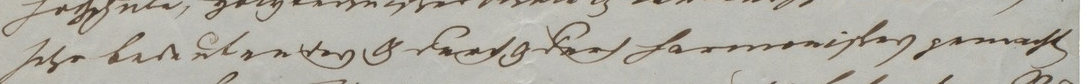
sehr bedeutendes & durch & durch harmonisches gemacht
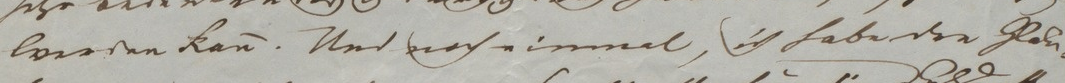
werden kann. Und noch einmal, ich habe den Glau-
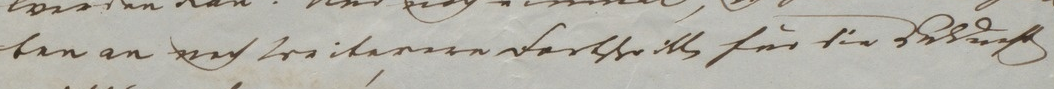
ben an noch weiterern Fortschritt für die Zukunft
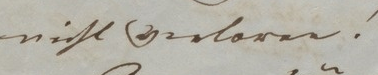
nicht verloren!
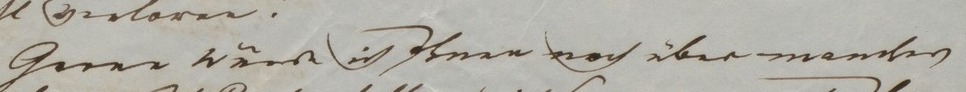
Gerne würde ich Ihnen noch über manches
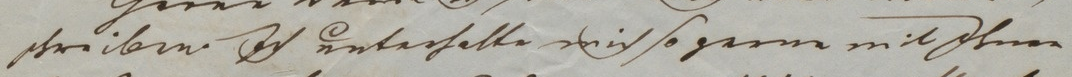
schreiben. Ich unterhalte mich so gerne mit Ihnen.
